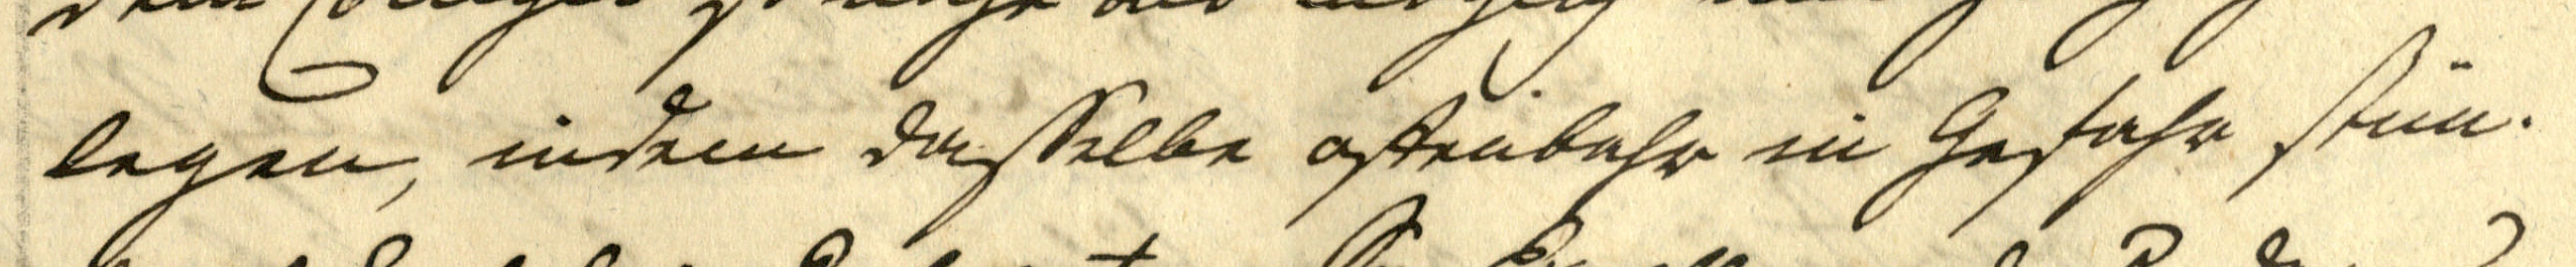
legen, indem dasselbe offenbahr in Gefahr stün¬
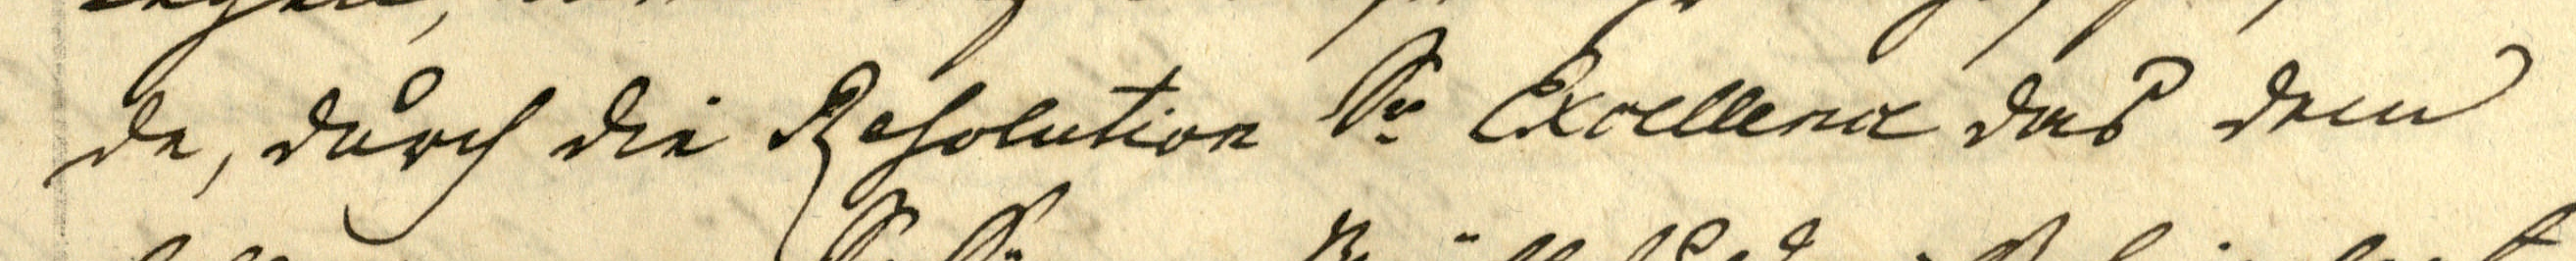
de, durch die Resolution Sr Excellence das dem
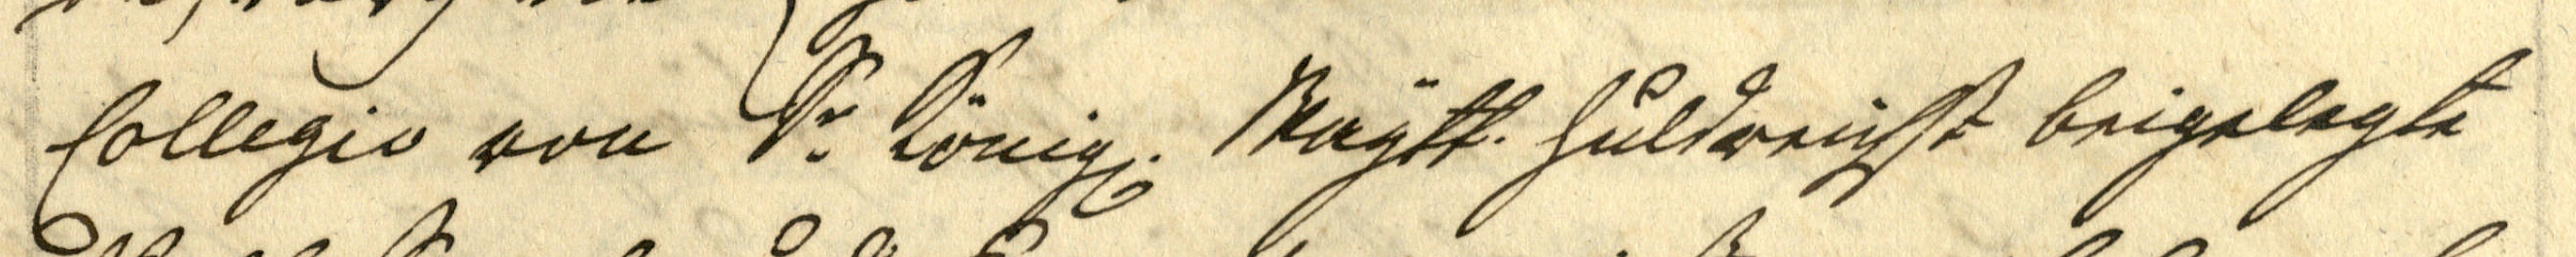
Collegio von Sr. Königl. Maÿtt. huldreichst beigelegte
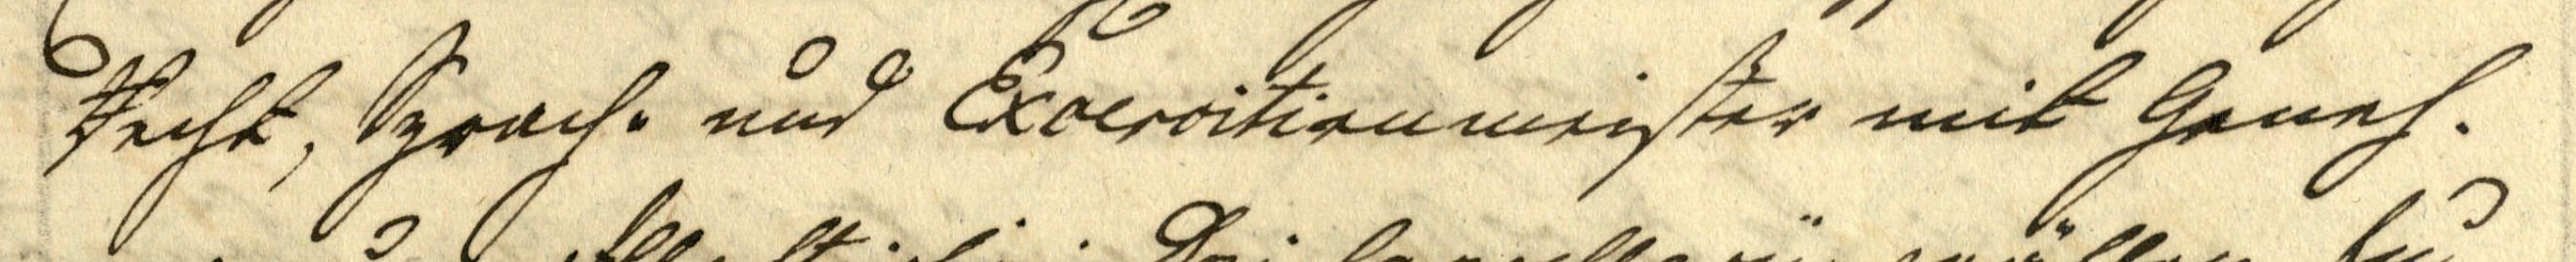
Recht Sprach- und Excercitienmeister mit Geneh¬
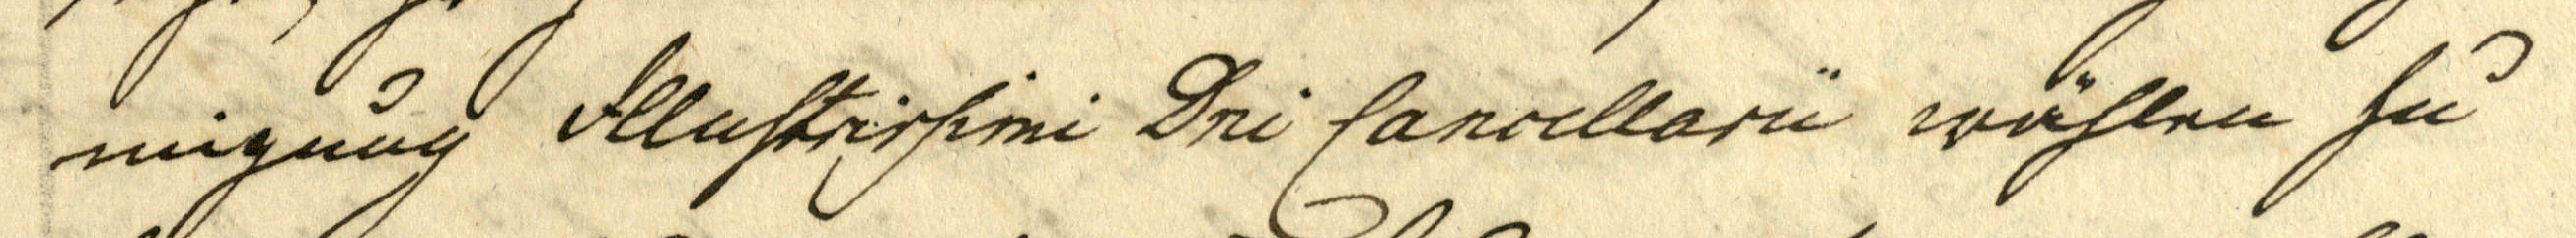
migung Illustrissimi Dni Cancellarii wählen zu
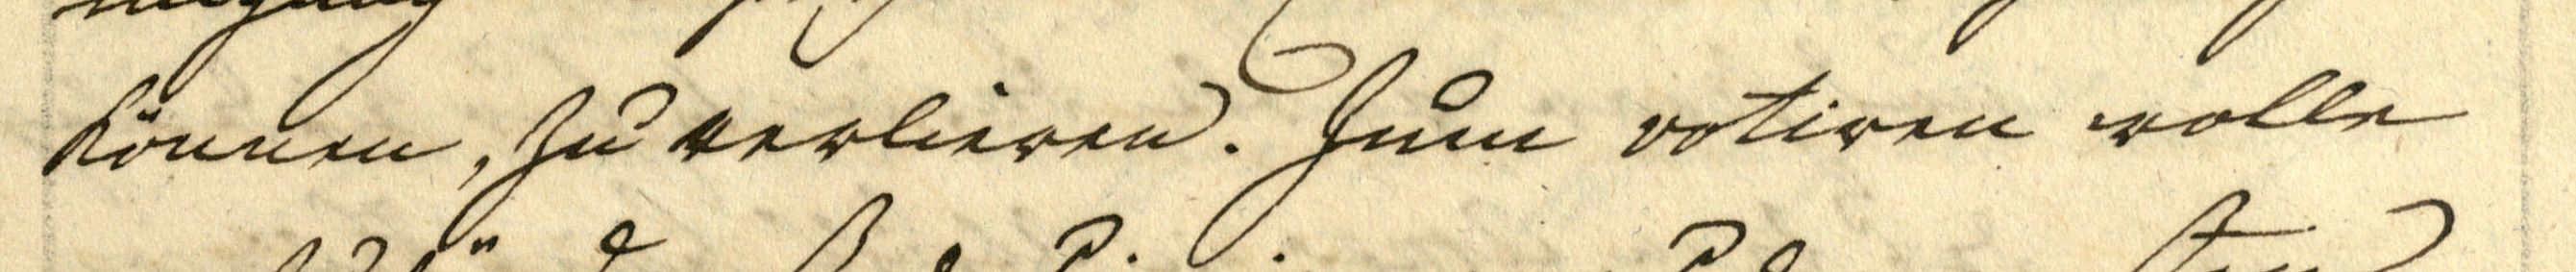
können, zu verlieren. Zum votiren wolle
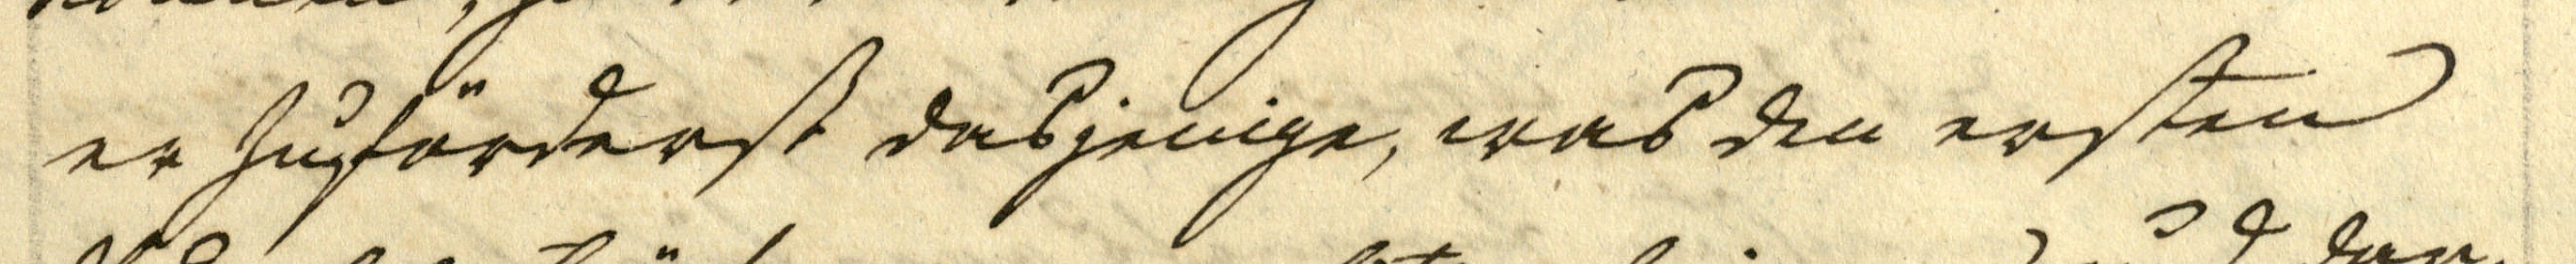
er zuförderst dasjenige, was den ersten
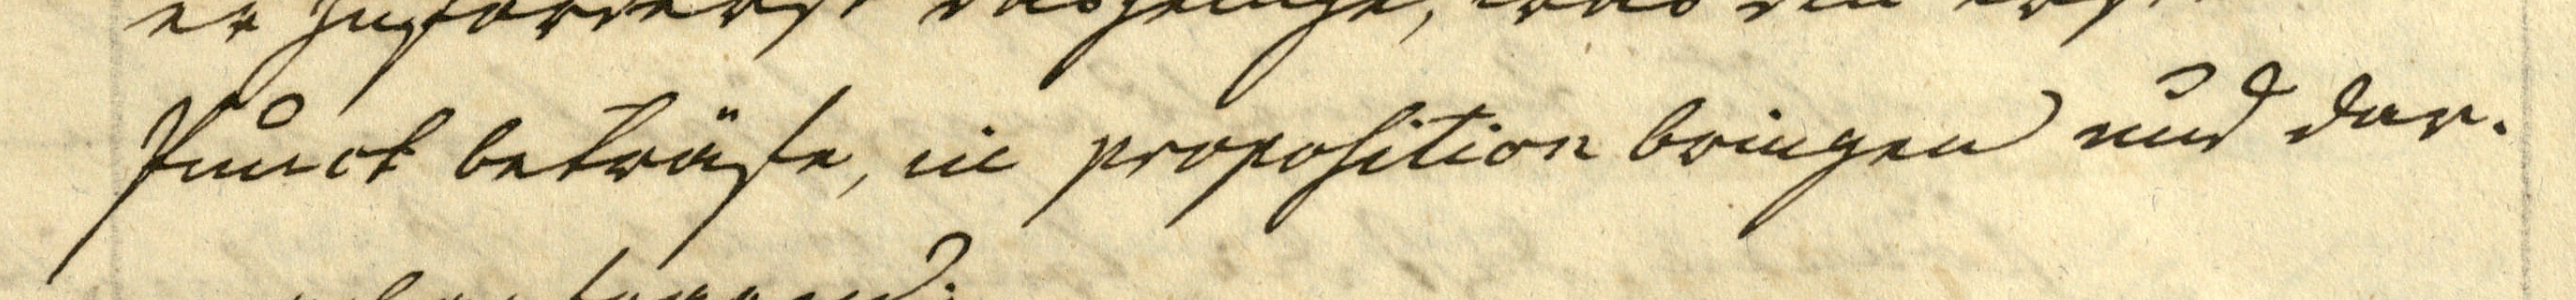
Punct beträfe, in proposition bringen und dar¬
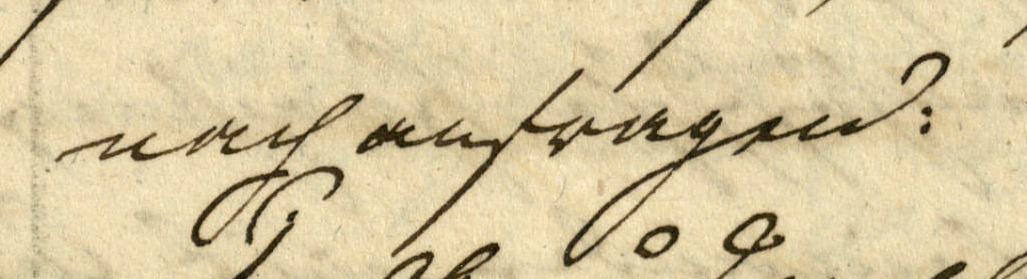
nach anfragen:
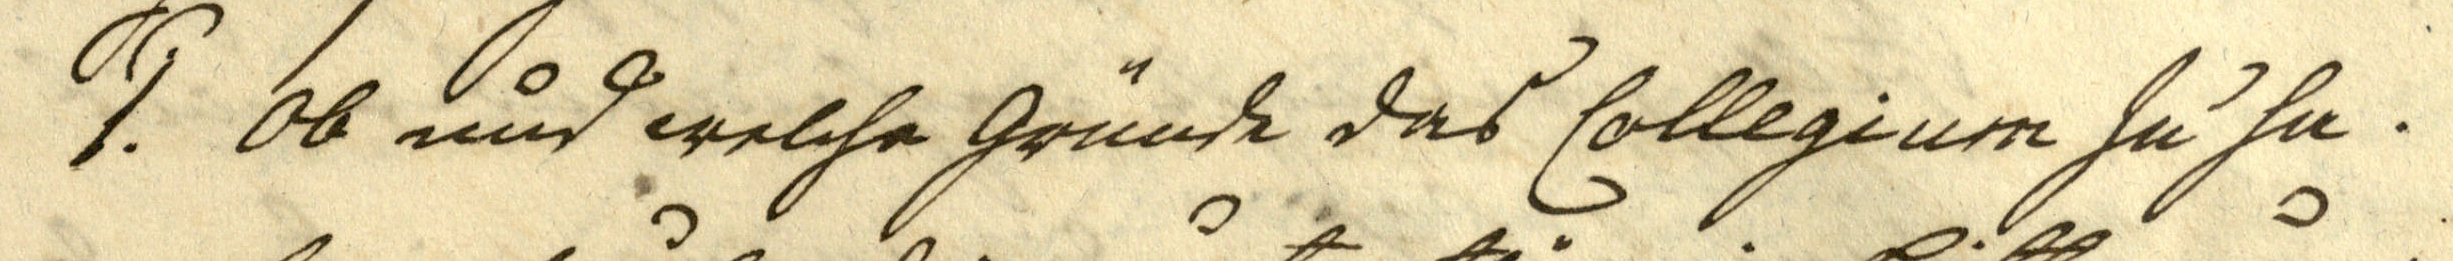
1. Ob und welche Gründe das Collegium zu ha¬
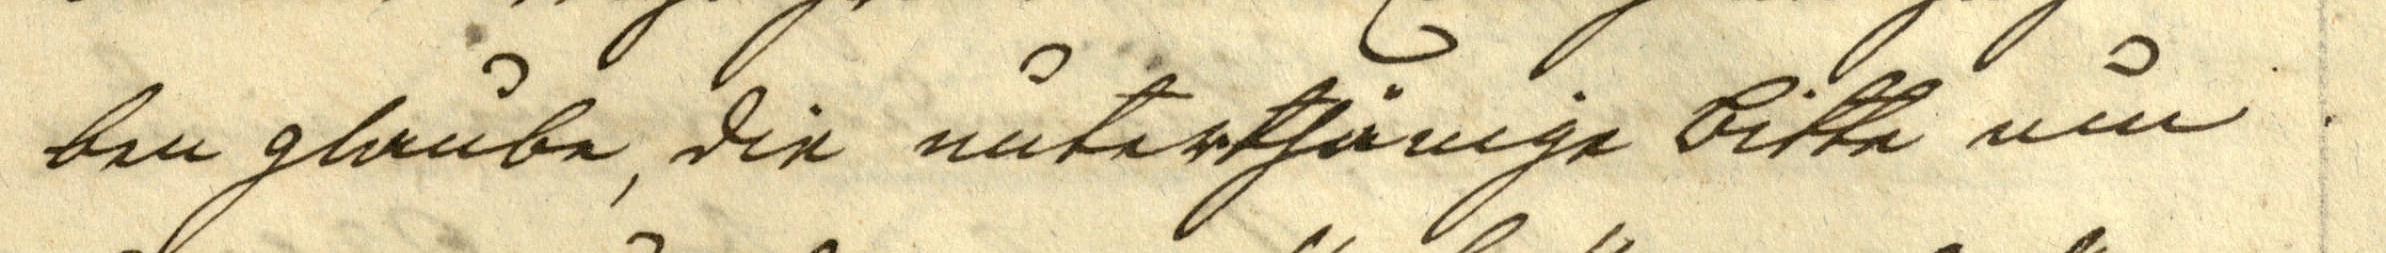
ben glaube, die unterthänige Bitte um
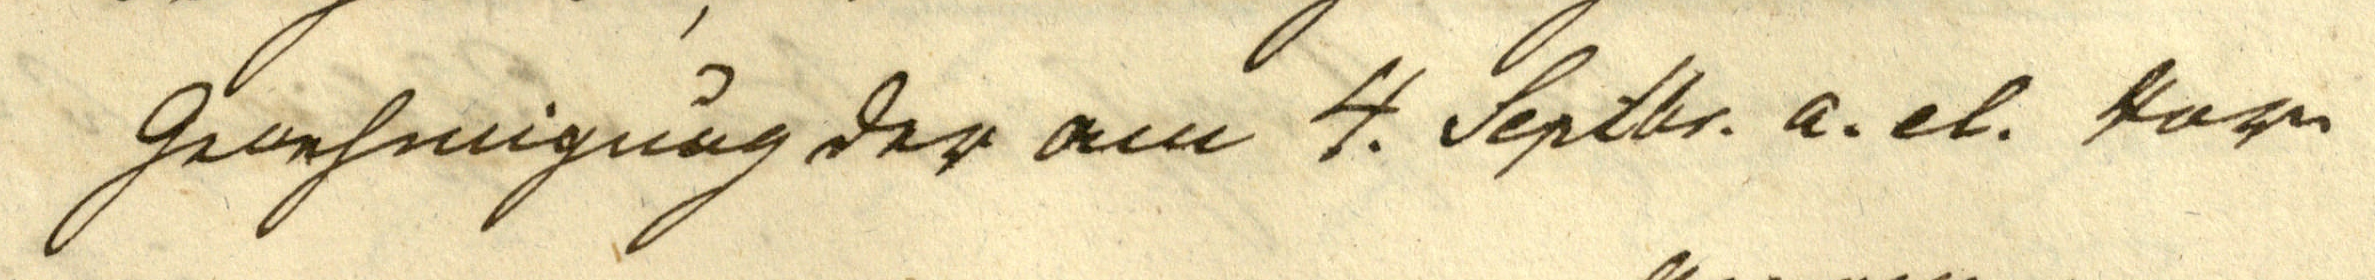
Genehmigung der am 4. Septbr. a. et. vor¬
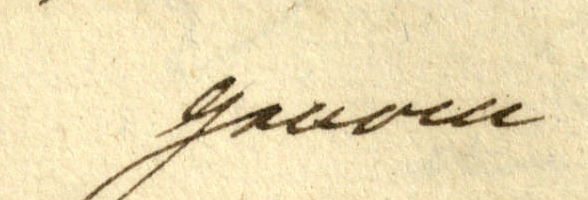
genom
